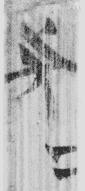先=
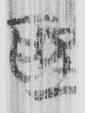聖
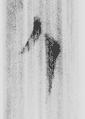人
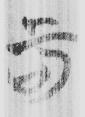可
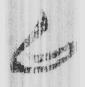㠯（以）
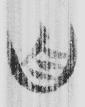自
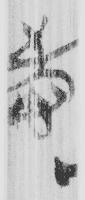㤅
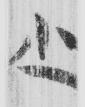少
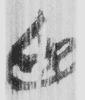臣
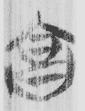合
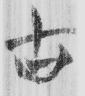古
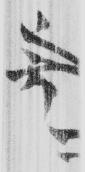先=
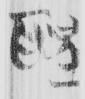聖
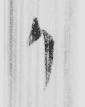人
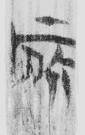所
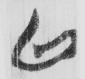㠯（以）
